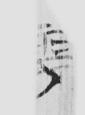𩁹
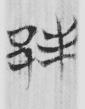邦
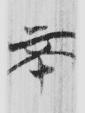不
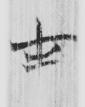才
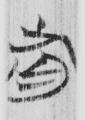歬
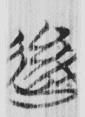後
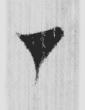丁
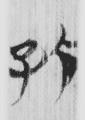孤
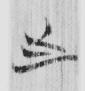之
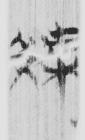殜
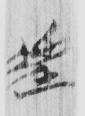𫊟
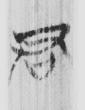君
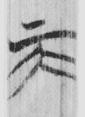天
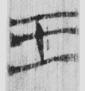王
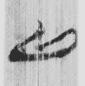㠯（以）
